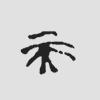天
